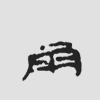雨
